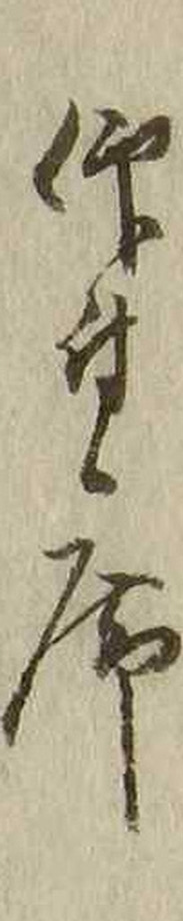仰付候席
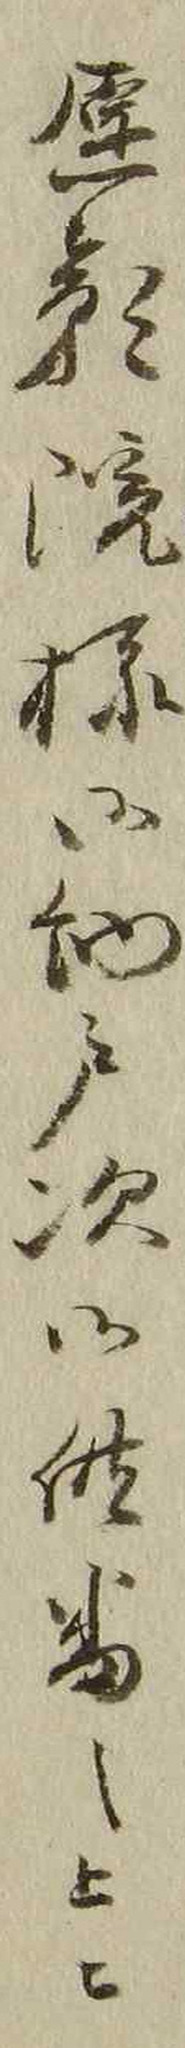愿彰院様御納戸次御供番之上被
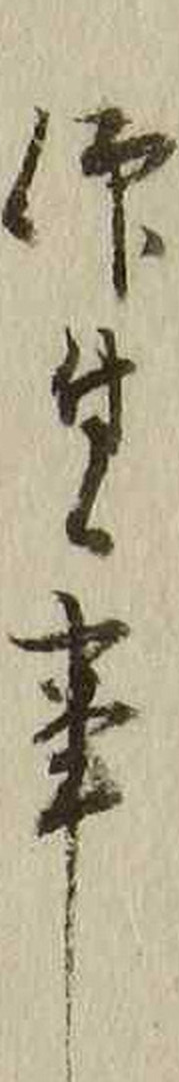仰付候事
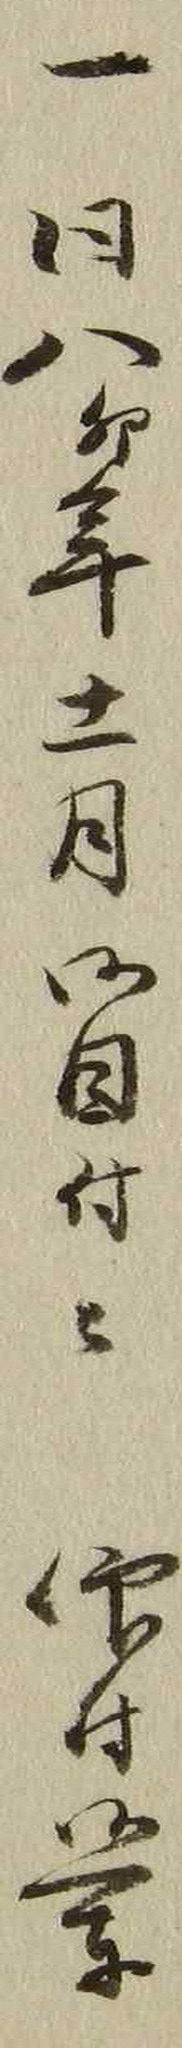一同八卯年十一月御目付被仰付御軍
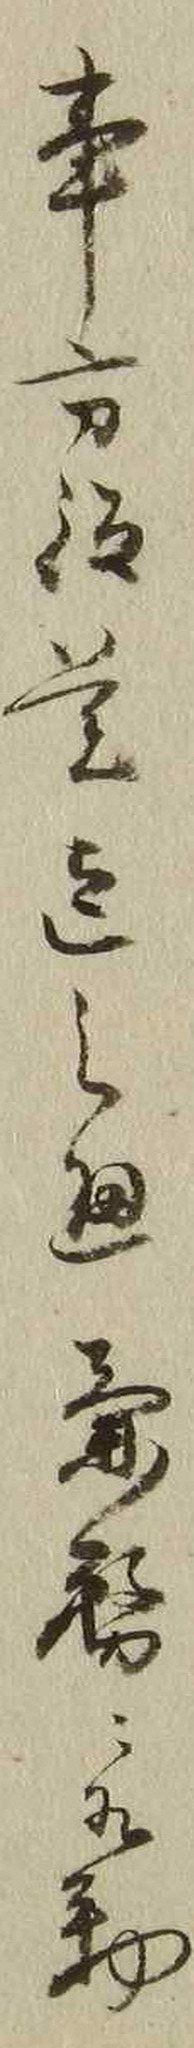事方役是迄之通兼務ニ相勤
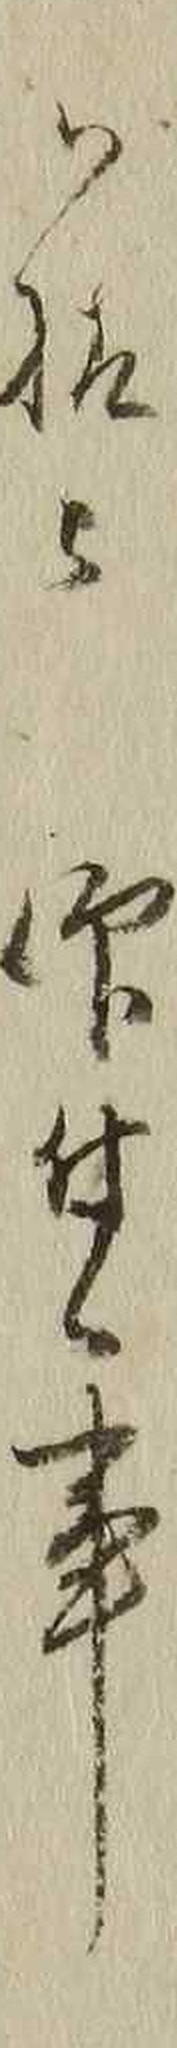候様被仰付候事
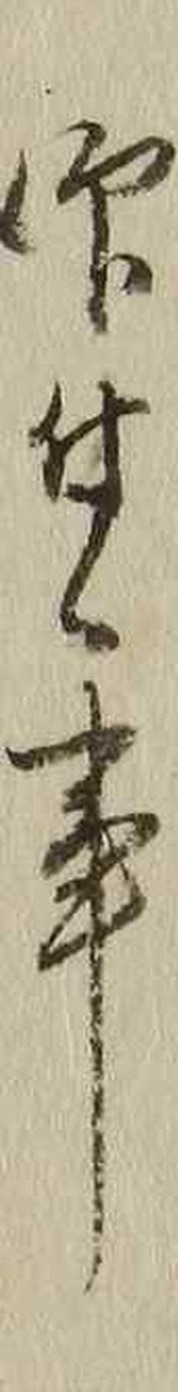仰付候事
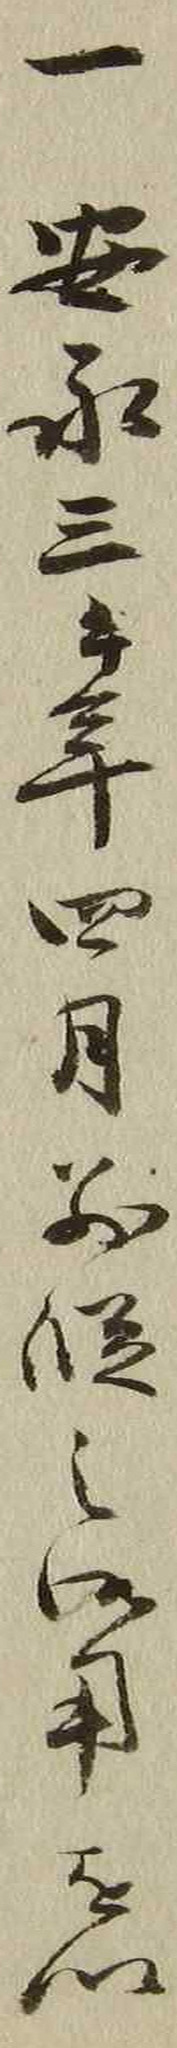一安永三午年四月前段之御用を以
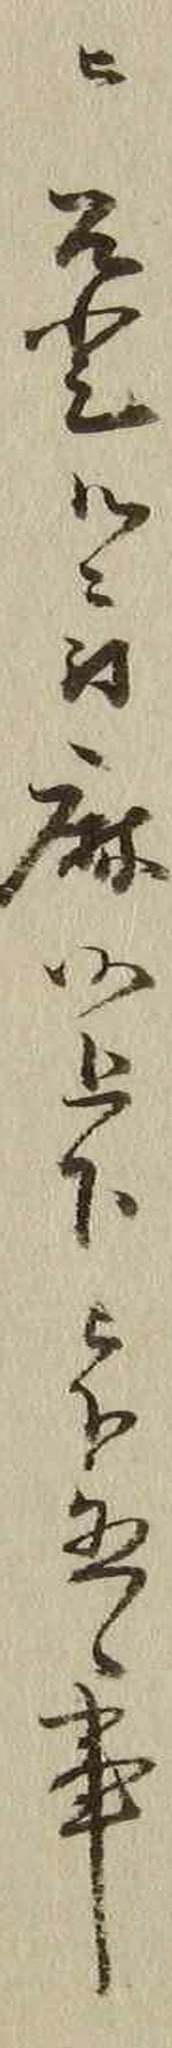被召登候ニ付麻御上下被下置候事
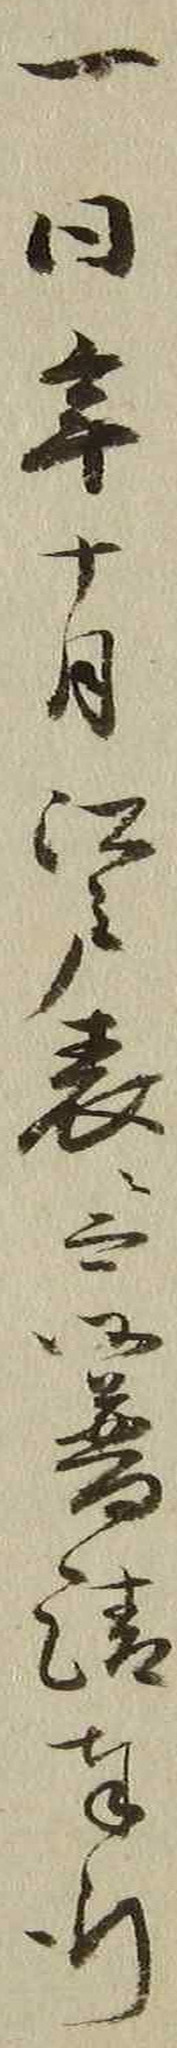一同年十月江戸表ニ而普請奉行
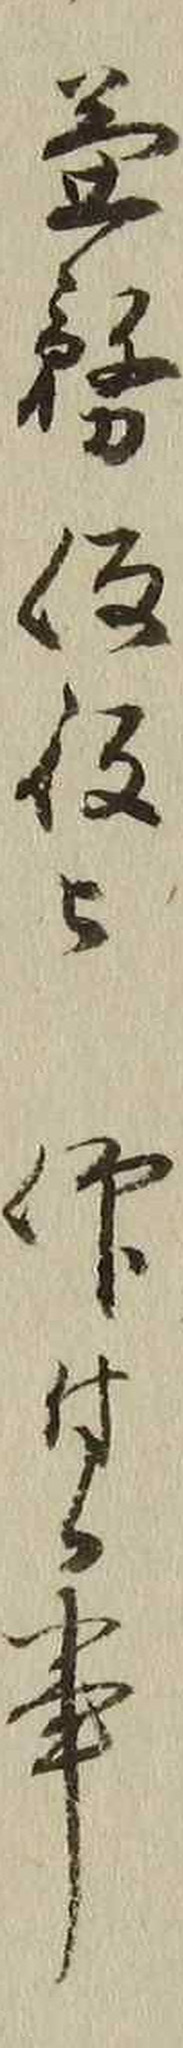兼務仮役被仰付候事
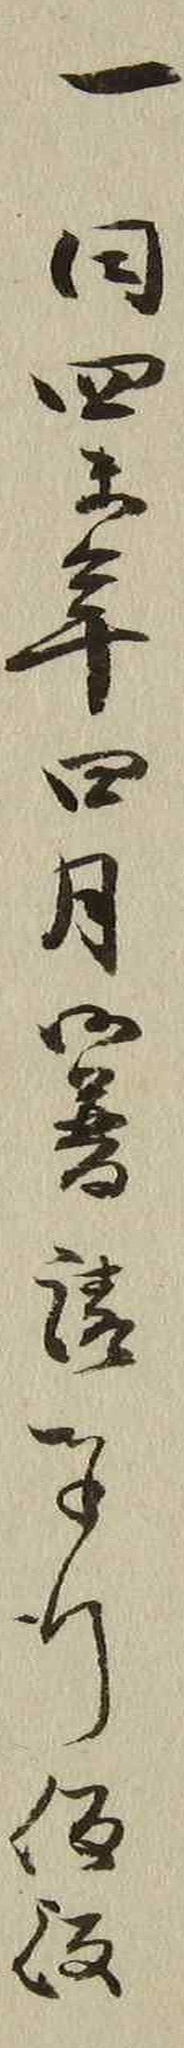一同四未年四月御普請奉行仮役
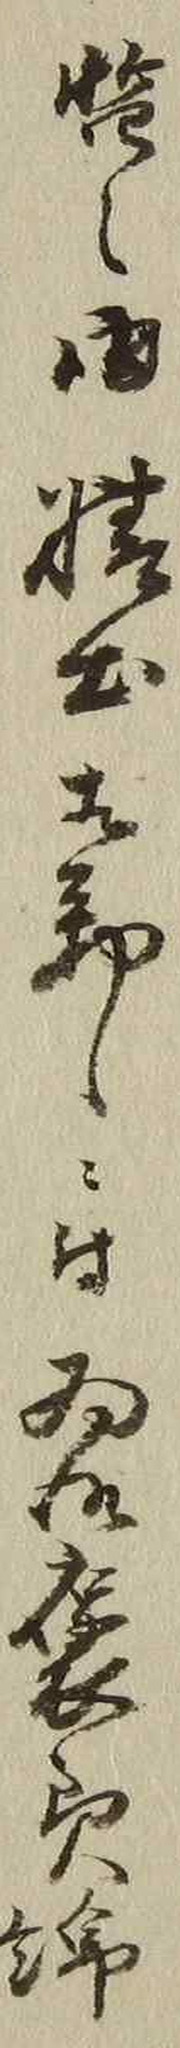暫之由精出相勤候ニ付為御褒美綿
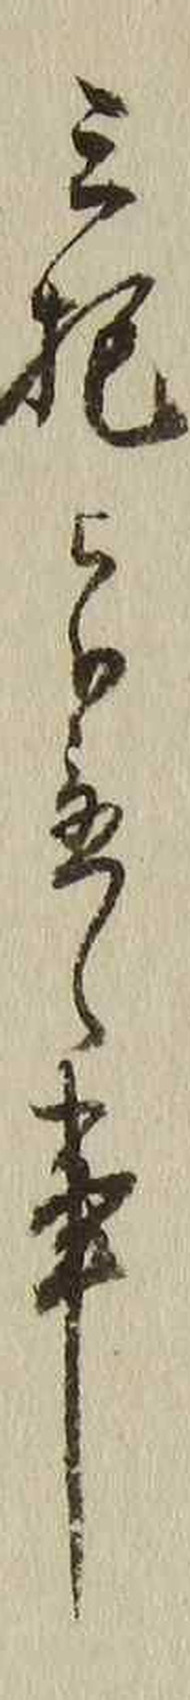三把被下置候事
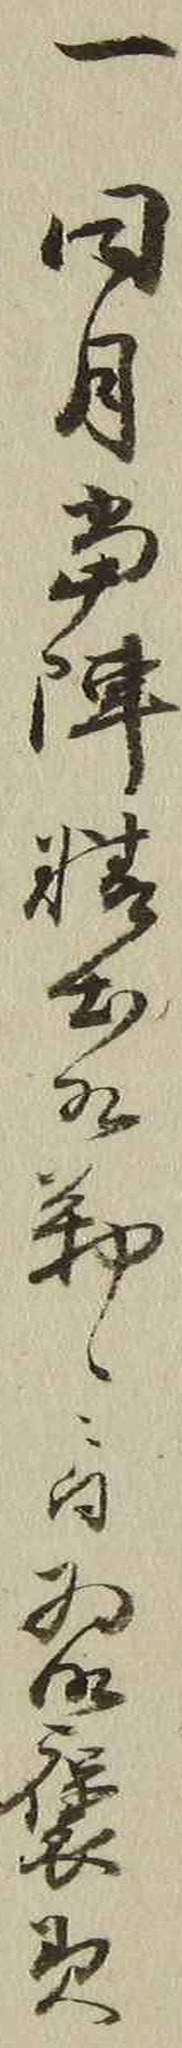一同月当陣精出相勤候ニ付為御褒美
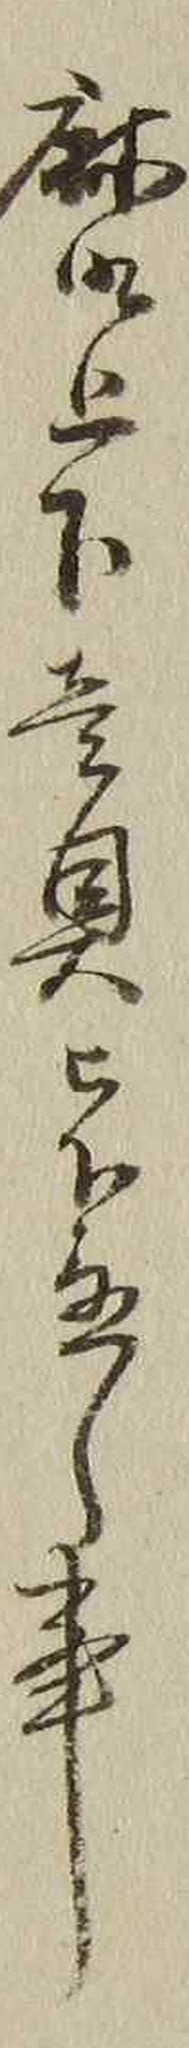麻御上下壱具被下置候事
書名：諸士系譜　巻之236　ふ之部4
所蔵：会津若松市立会津図書館
